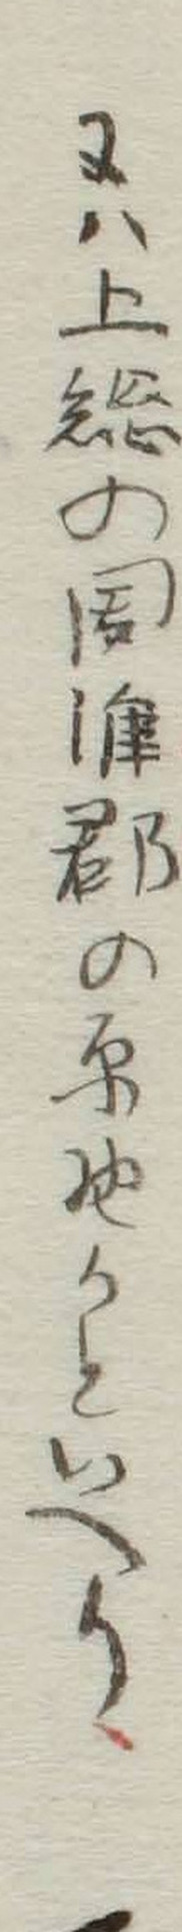又は上総の周准郡の原野かといへり、
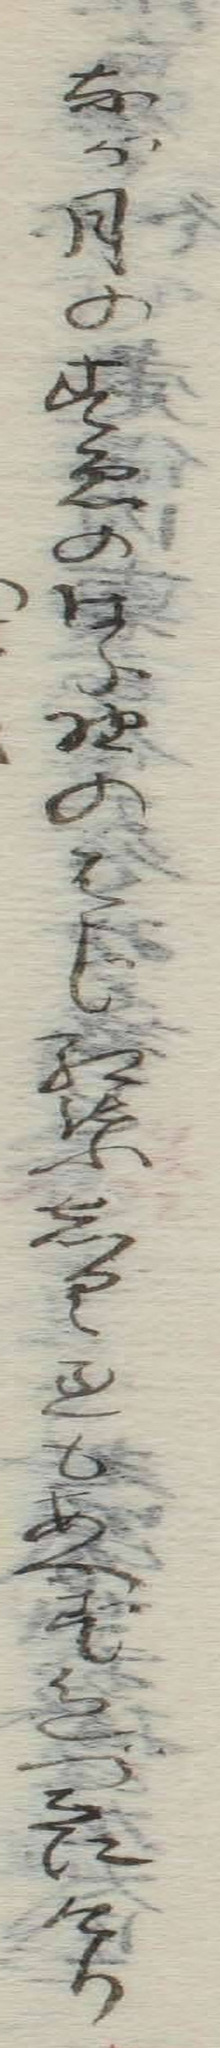なが月のすゑのはら野のはじ紅葉しくれもあへず色づきにけり松モ

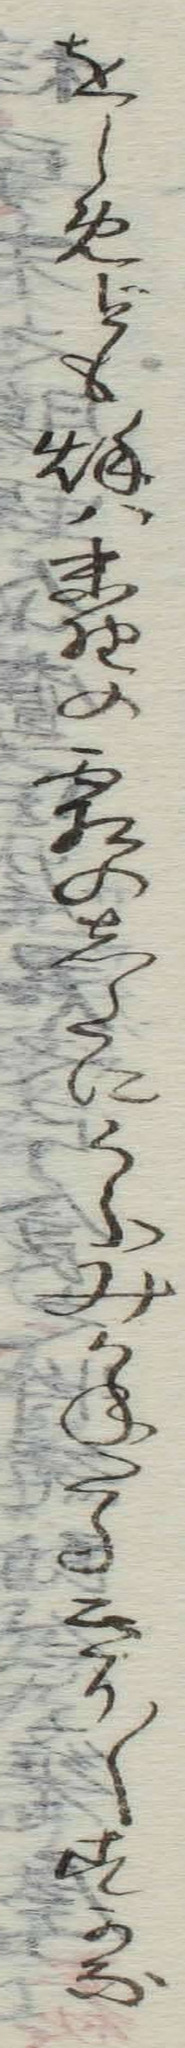をしめども秋は末野の霜のしたにうらみかねたるきり〳〵すかな
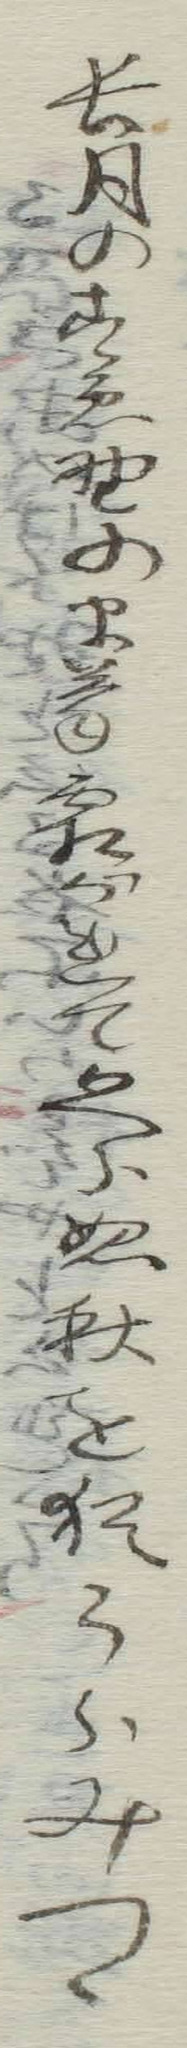長月のすゑ野のま葛霜がれてかへらぬ秋を猶うらみつゝ
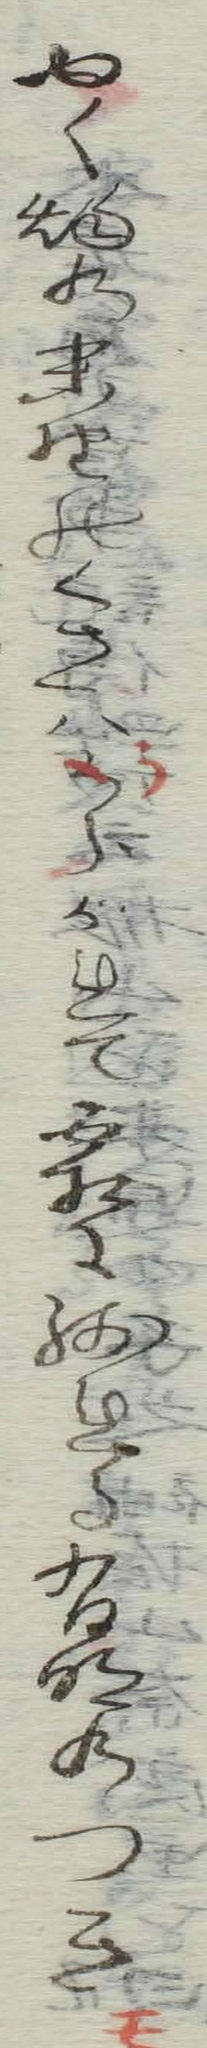ゆく秋の末野のくさはうらがれて霜に残れる有明のつきモ
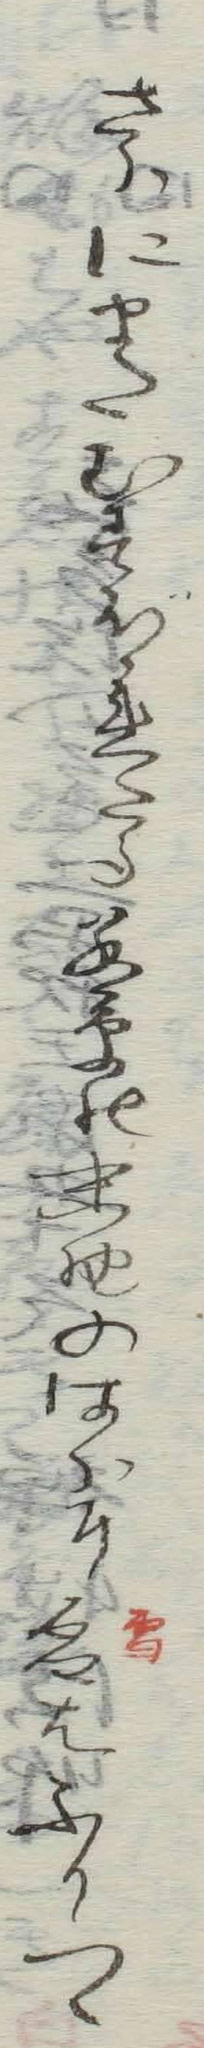さらにまたむすぼゝれたる若草の末野のはらに雪はふりつゝ
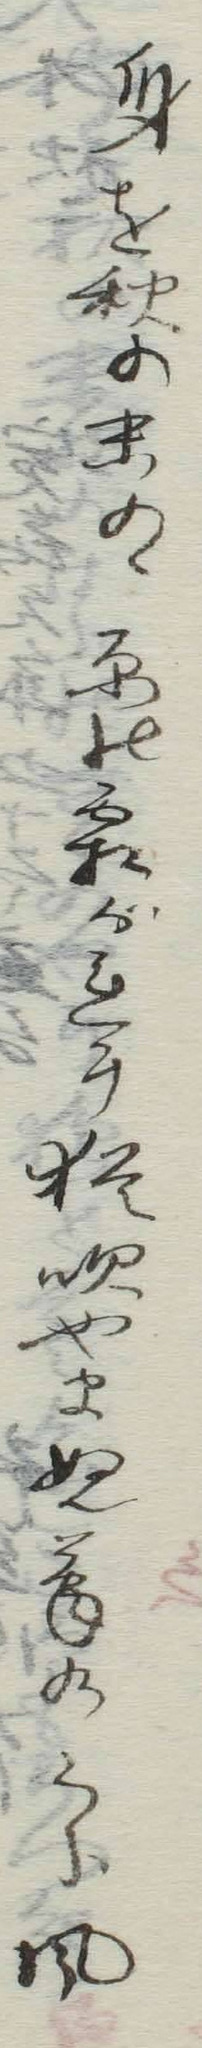身を秋の末のゝ原の霜がれに猶吹きやまぬ葛のうら風
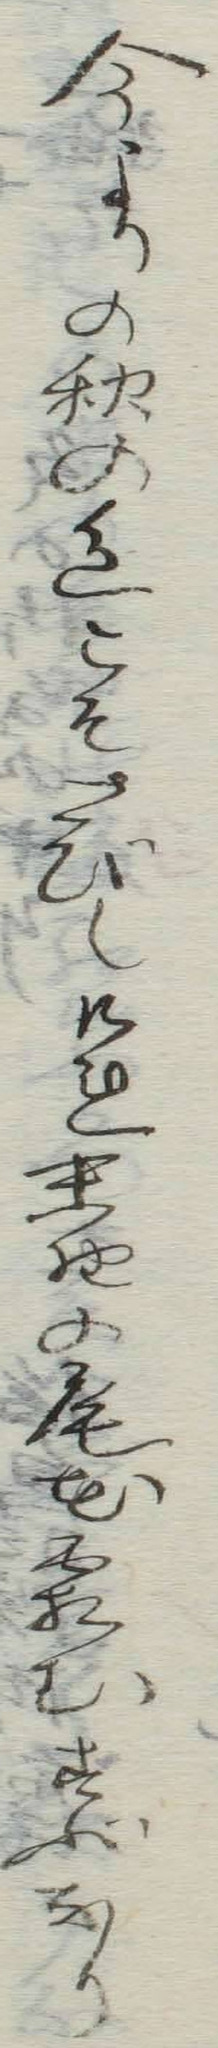今よりの秋の色こそさびしけれ末野の尾花霜むすぶなり
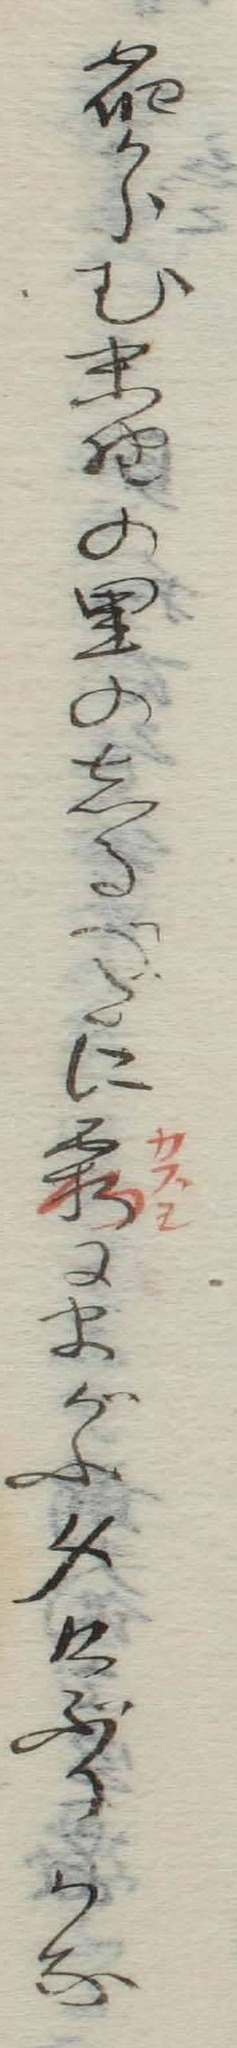宿からむ末野の里のしるべだに霞にまがふ夕けぶりかな
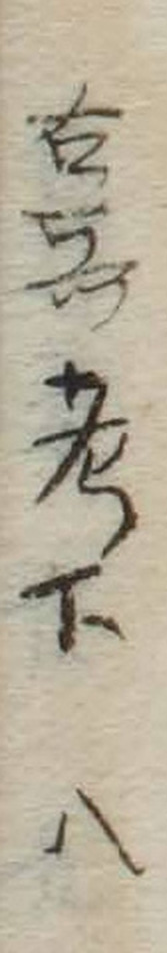古歌考下八

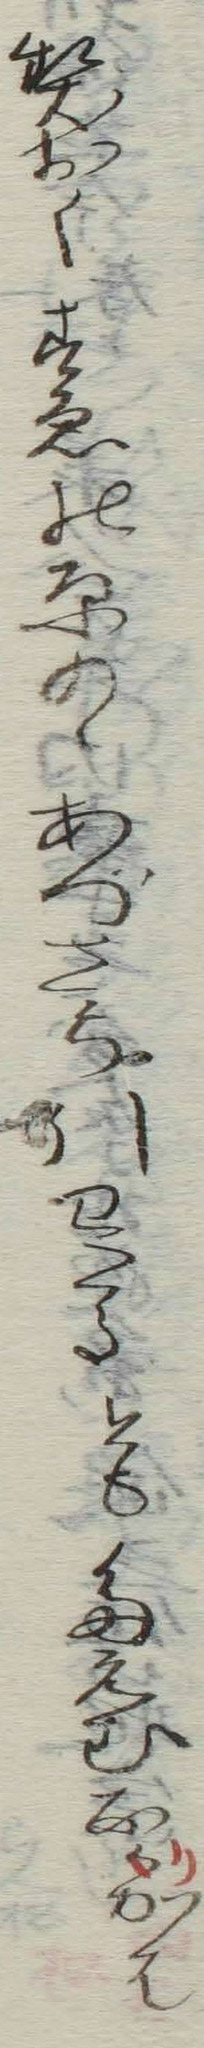契おくすゑの原のゝあづさ弓引わたるともたえむなりかは
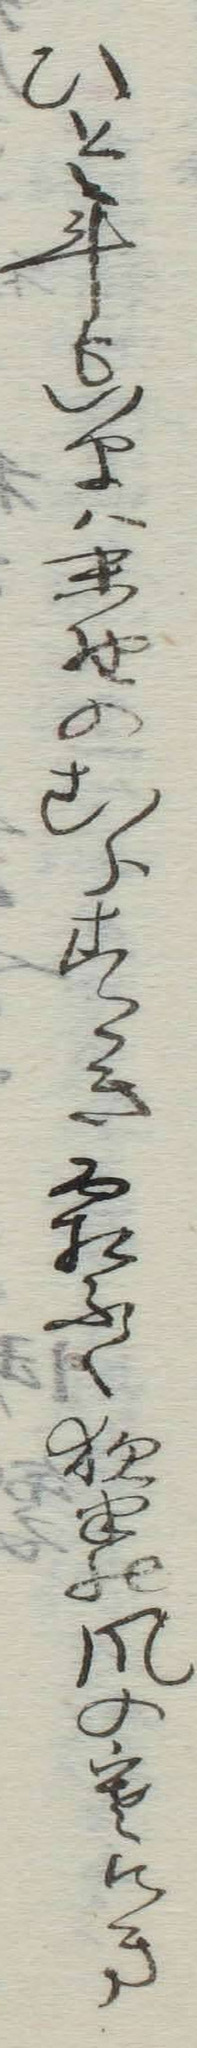ひと年もいまは末野のむらすゝき霜ふく夜半の風の寒けき
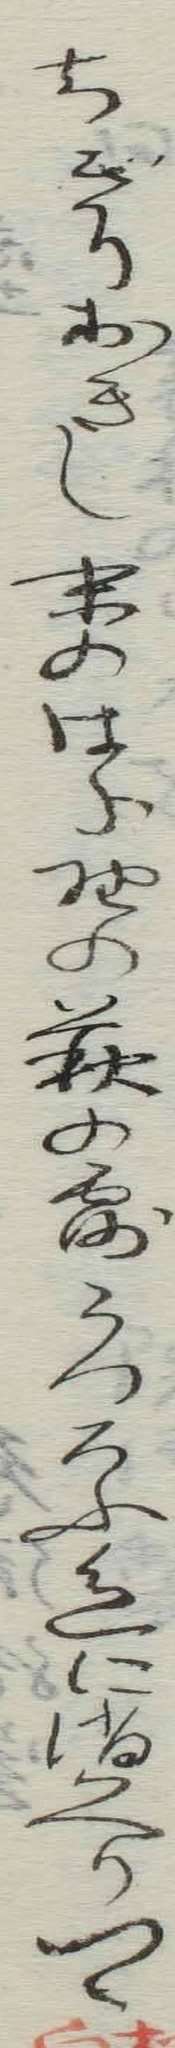ちぎりおきし末のはら野の萩の露うつろふ色に消かへりつゝ松白
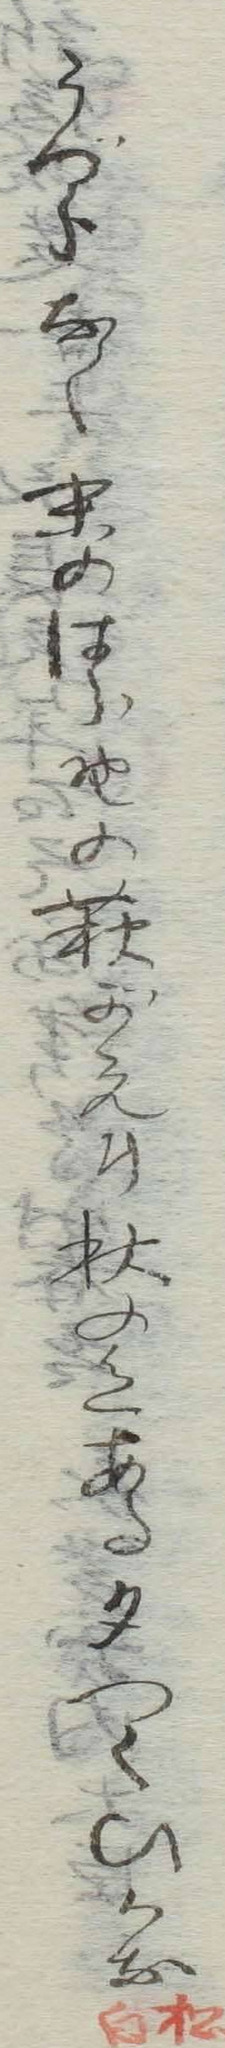うづらなく末のはら野の萩がえに秋の色ある夕つくひかな松白
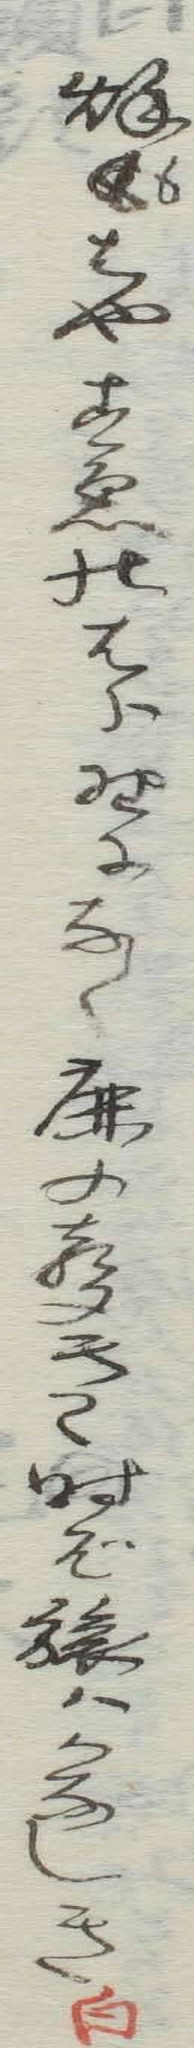秋もはやすゑのはら野になく鹿の声きく時ぞ旅はかなしき白
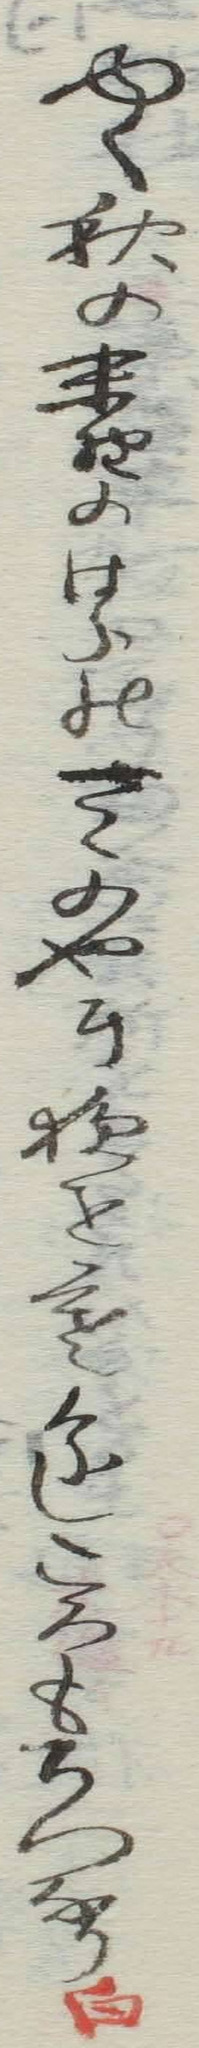ゆく秋の末野のはらのさゝのやに夜を寒からしころもうつなり白
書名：三河国古跡考
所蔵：国文学研究資料館
